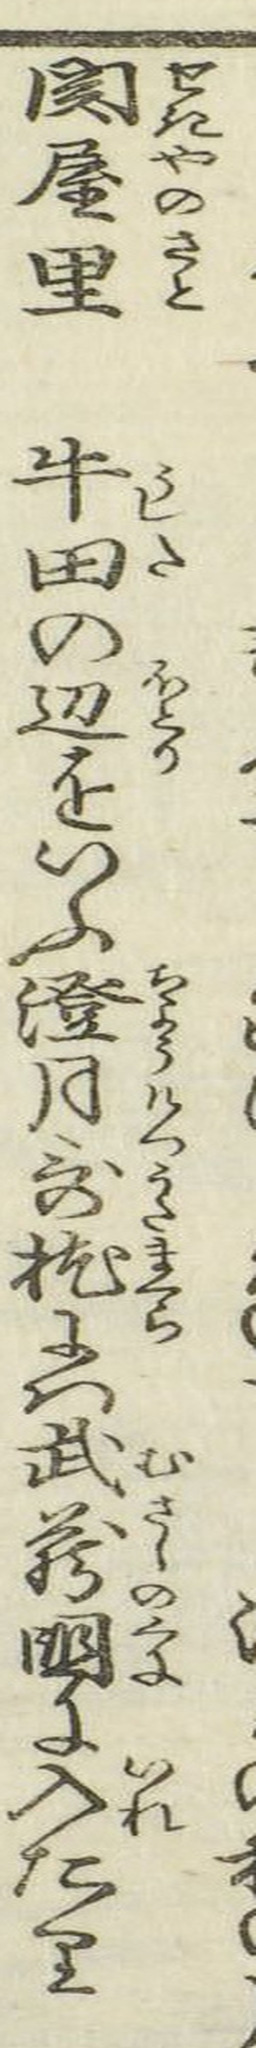関屋里牛田の辺をいふ澄月歌枕には武蔵国に入たり
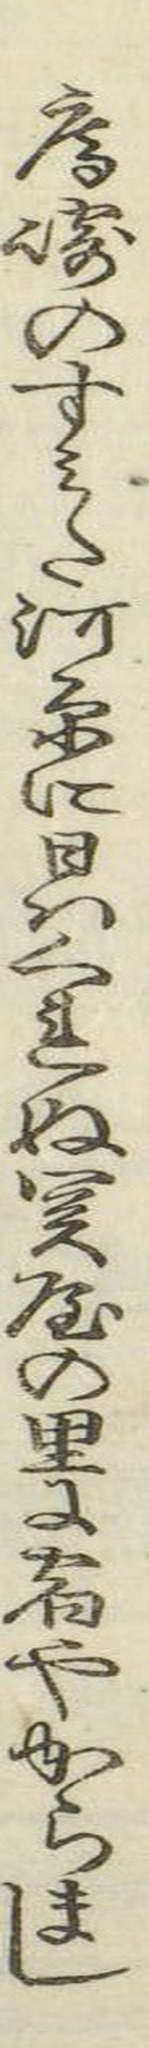庵崎のすみた河原に日はくれぬ関屋の里に宿やからまし
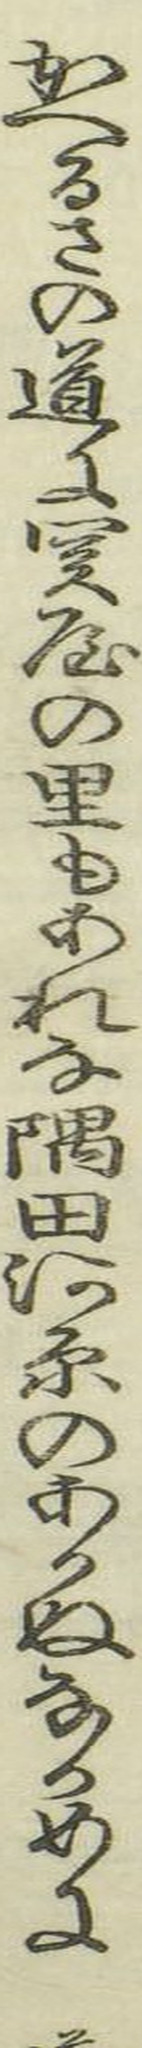かへるさの道に関屋の里もあれな隅田河原のあかぬなかめに道晃親王

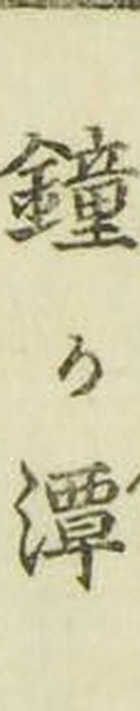鐘か潭
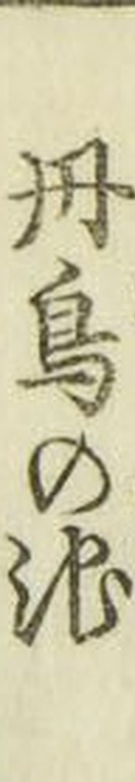丹頂の池
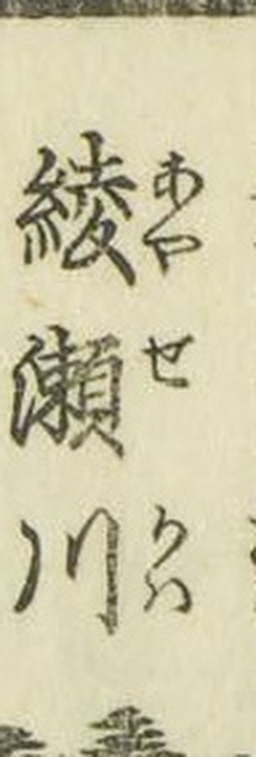綾瀬川
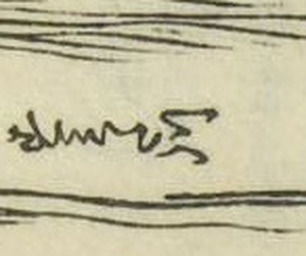すみた川
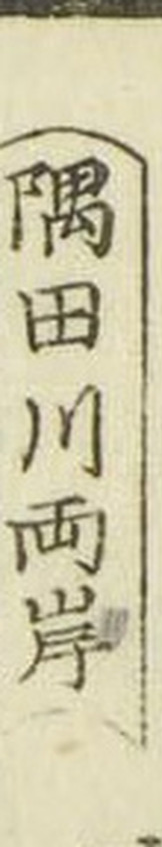隅田川両岸
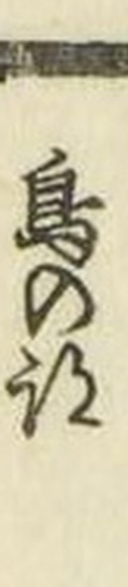鳥の跡
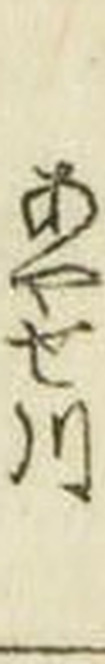あやせ川
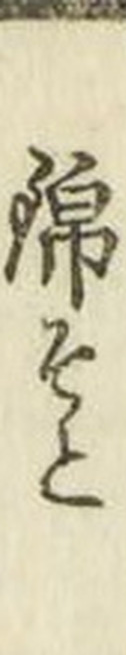錦そと
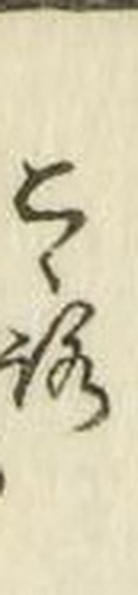こゝろ
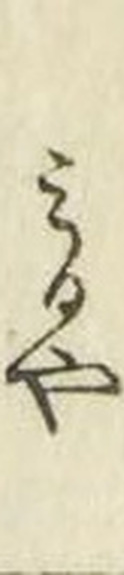みるや
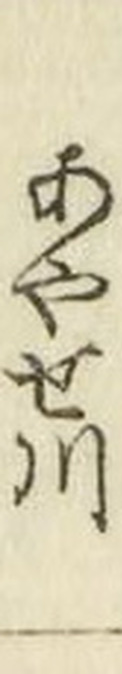あやせ川
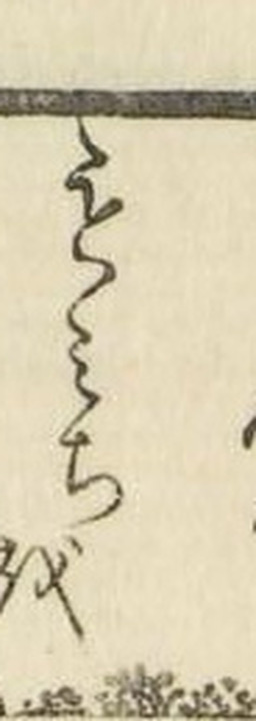もみちを
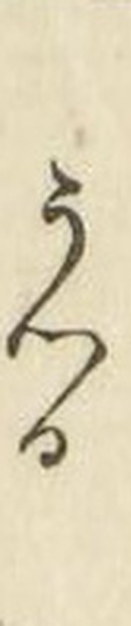うつる
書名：江戸名所図会 20巻 巻之19
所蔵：東京学芸大学教育コンテンツアーカイブ
